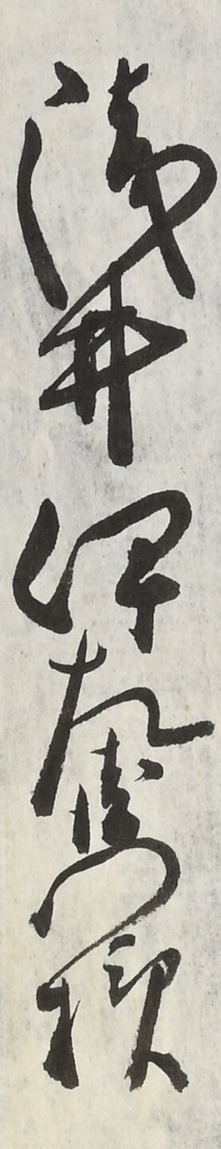浅井伊左衛門様
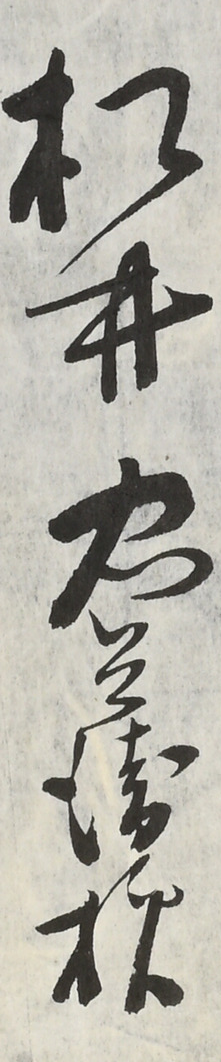松井忠兵衛様

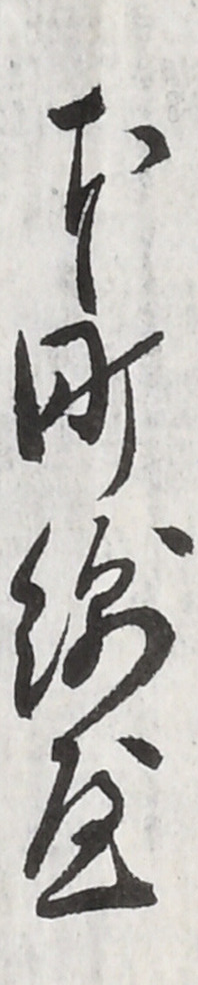本町綿屋
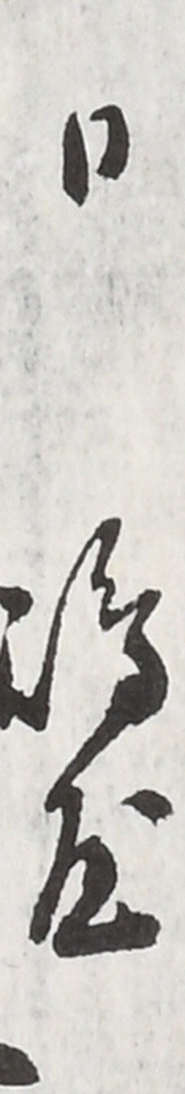同嶋屋
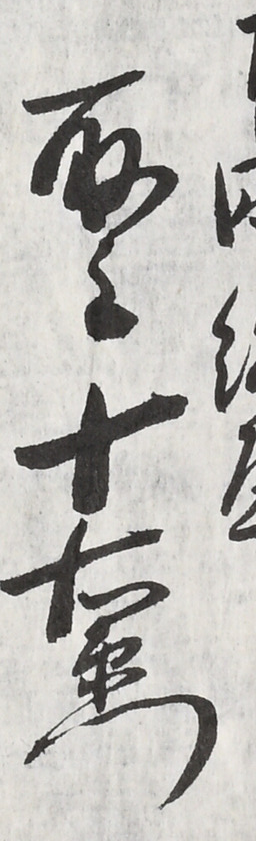取主十右衛門
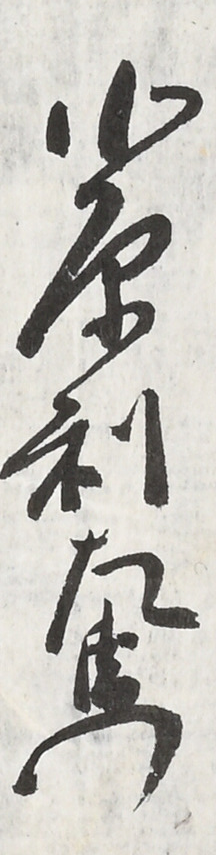北原利左衛門
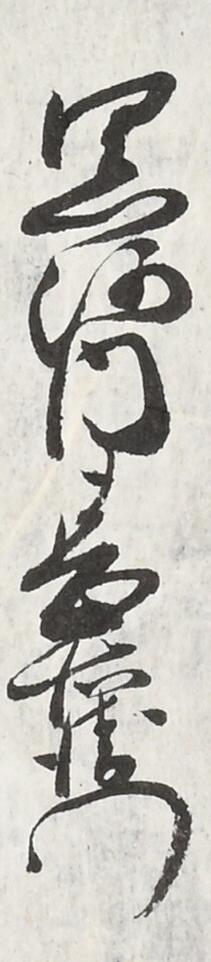黒河内甚右衛門
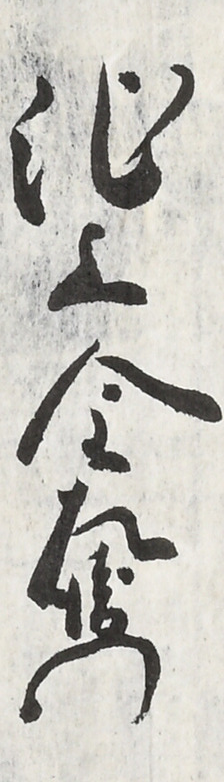池上金左衛門
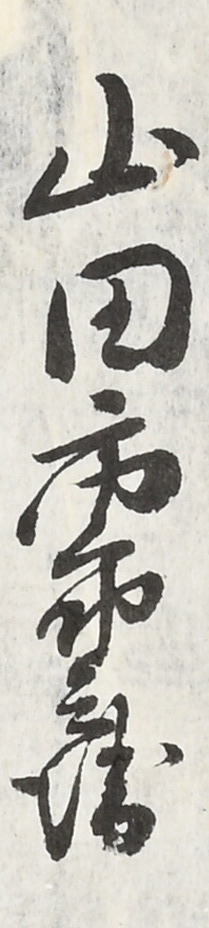山田市郎兵衛
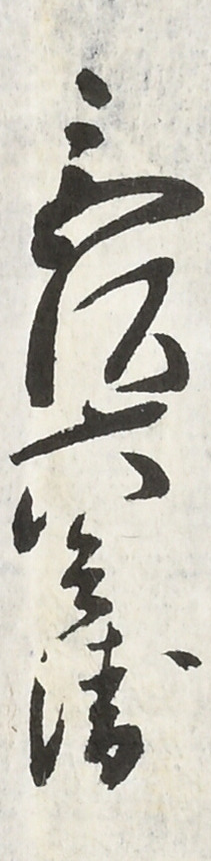宮沢六兵衛
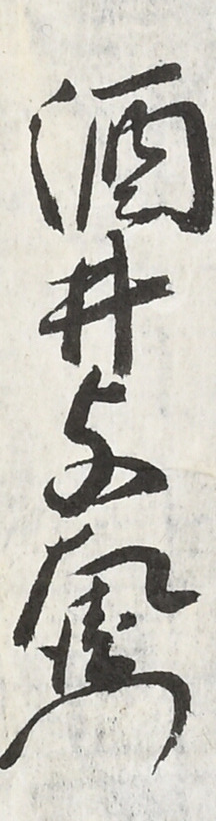酒井与左衛門
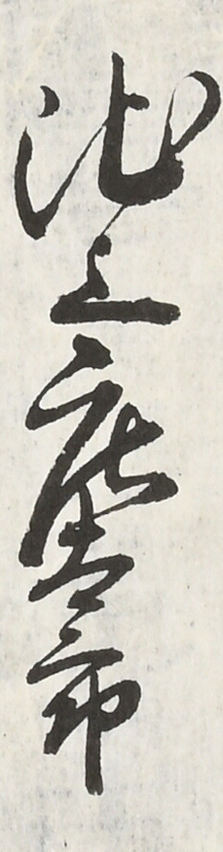池上庄太郎
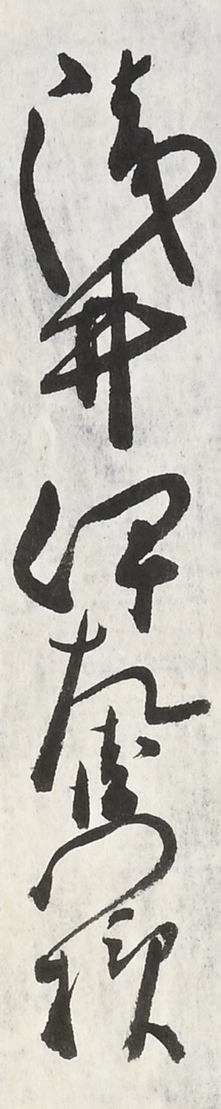浅井伊左衛門様
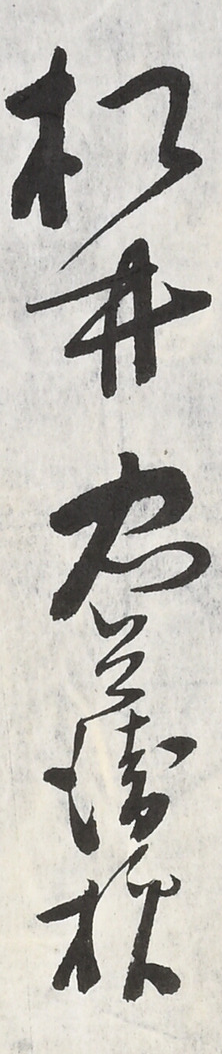松井忠兵衛様
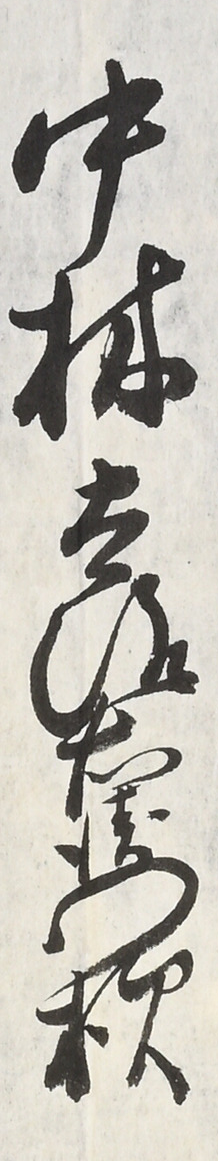中林太治右衛門様
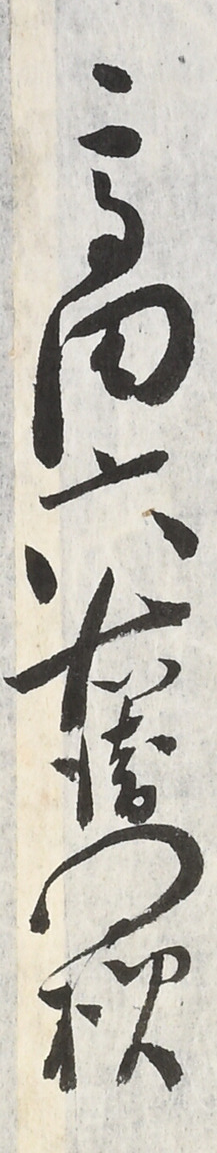高田六右衛門様
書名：覚
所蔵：伊那市立高遠町図書館・合同会社AMANE
